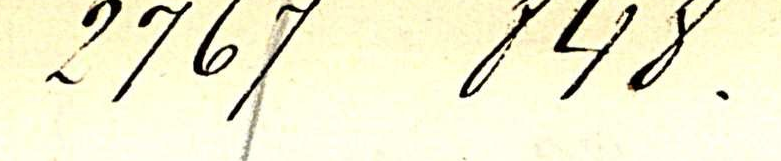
2767 848
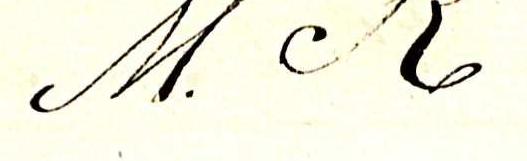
MR
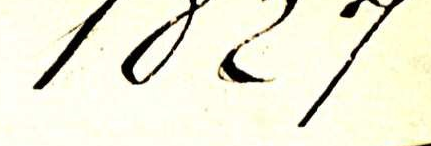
1827
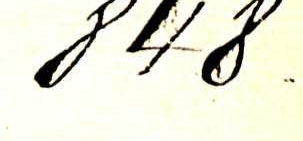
848
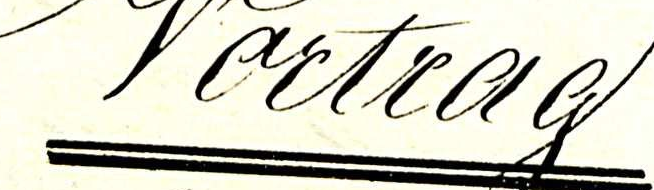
Vortrag
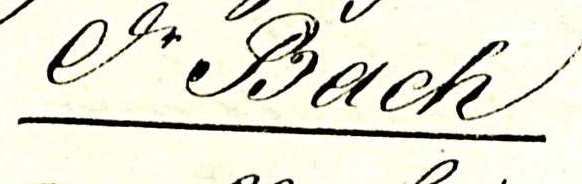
Dr Bach
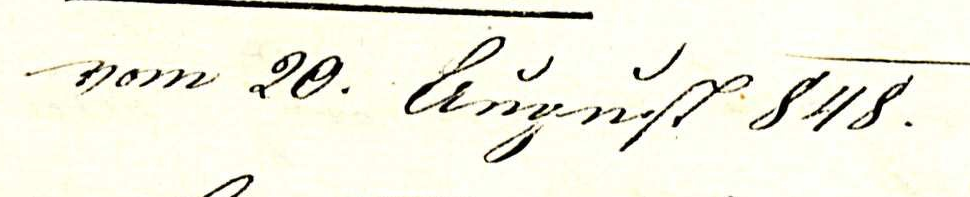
vom 20. August 848
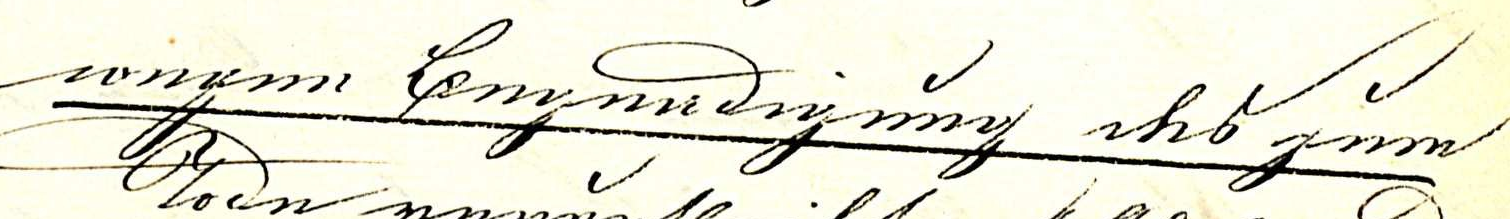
wegen Begnadigung des zum
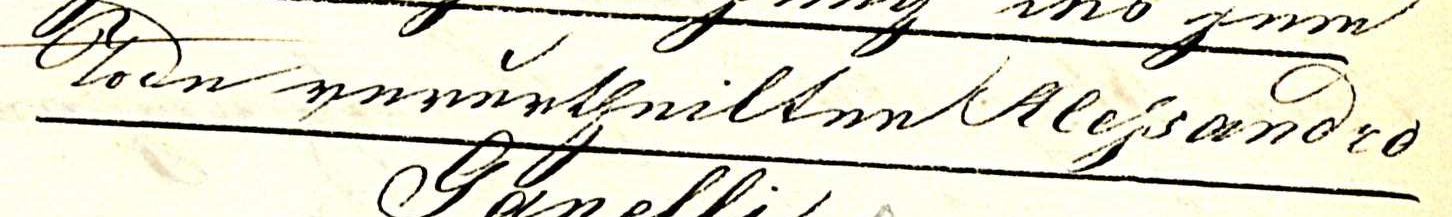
Tode verurtheilten Alessandro
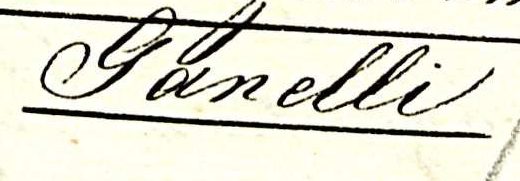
Ganelli
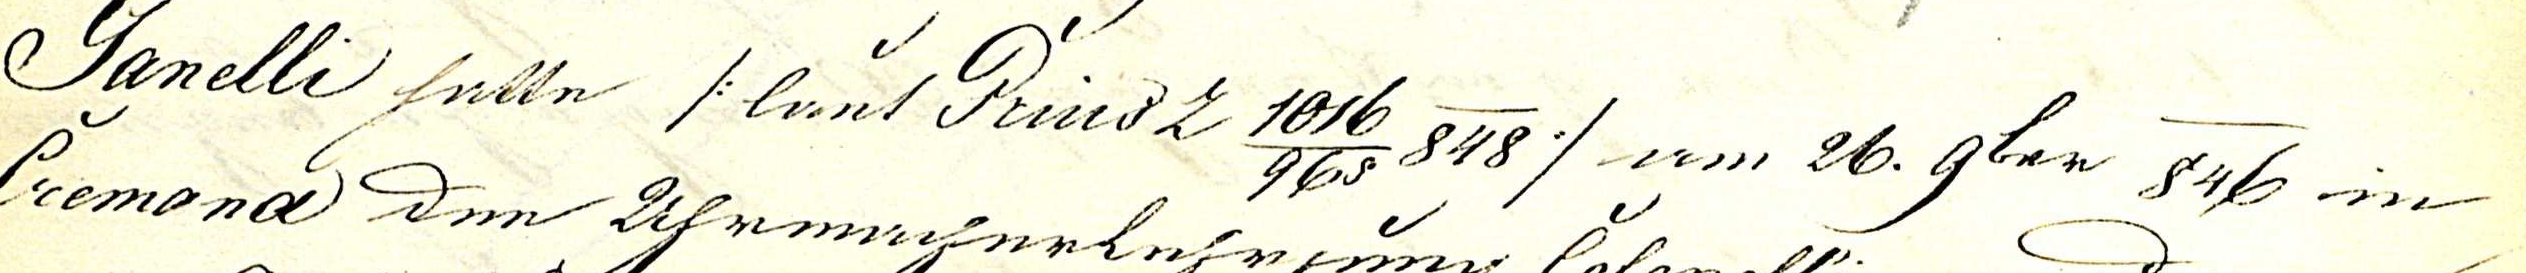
Ganelli hatte (latu Prius Z. 1016/965 [1]848) am 26. 9ber [1]846 in
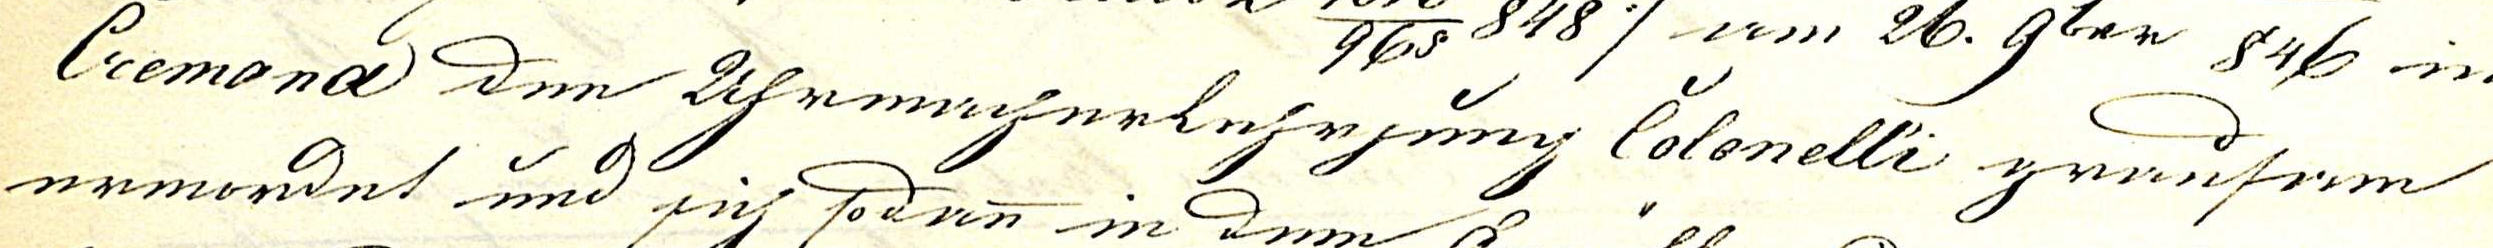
Cremona den Uhrmacherlehrjung Colonelli grausam
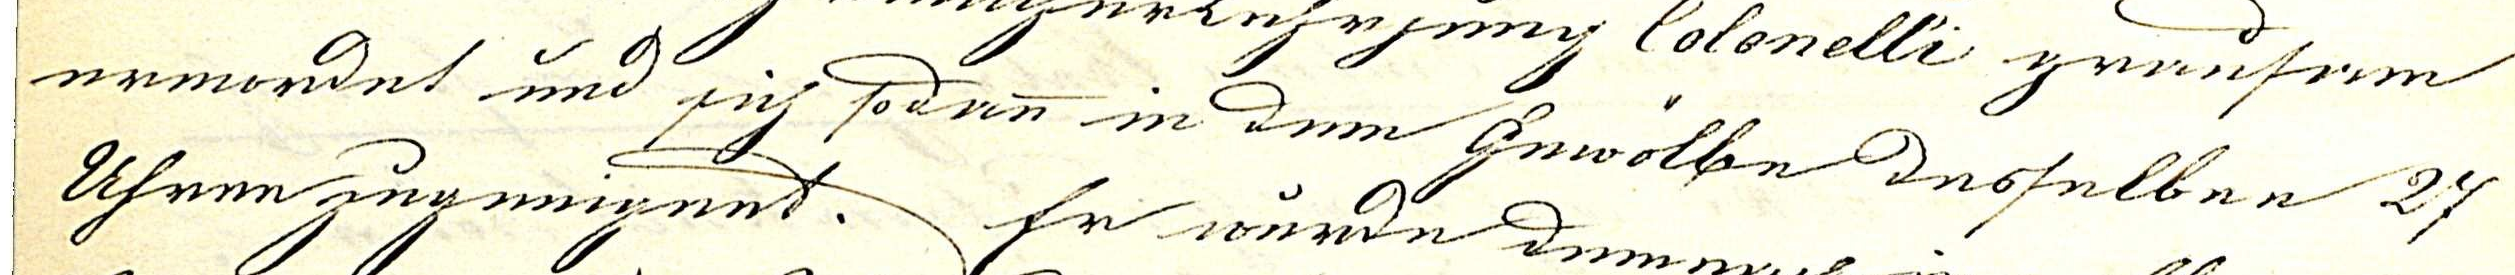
ermordet und sich sodann in dem Gewölbe desselben 27
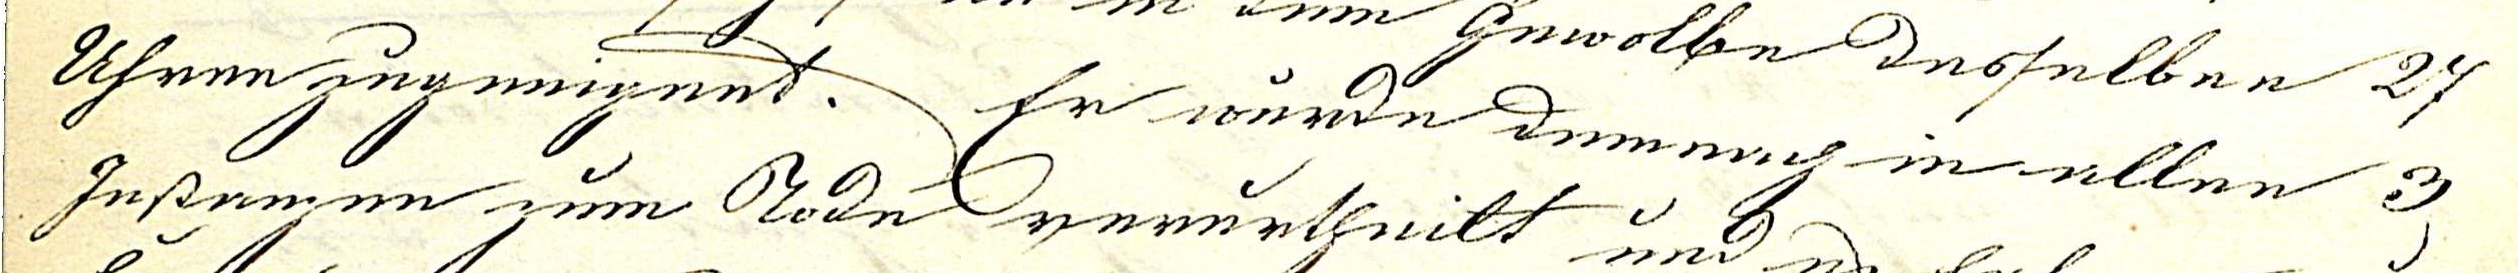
Uhren zugeeignet. Er wurde demnach in allen 3
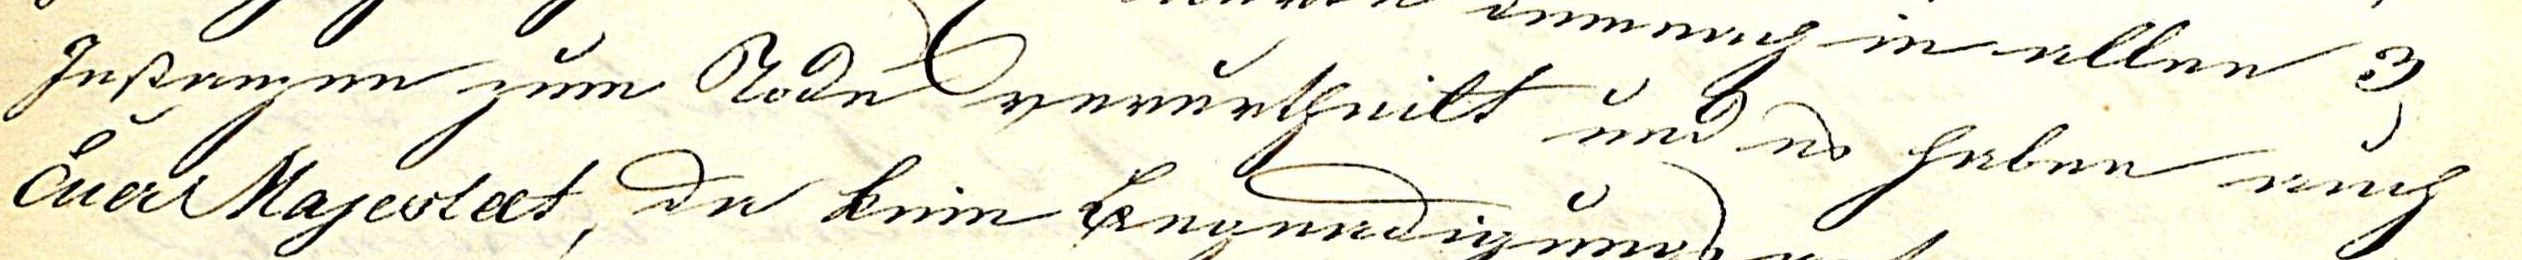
Instanzen zum Tode verurtheilt und es haben auch
